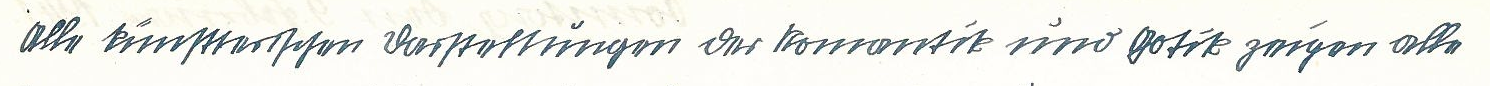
Alle künstlerischen Darstellungen der Romantik und Gotik zeigen alle
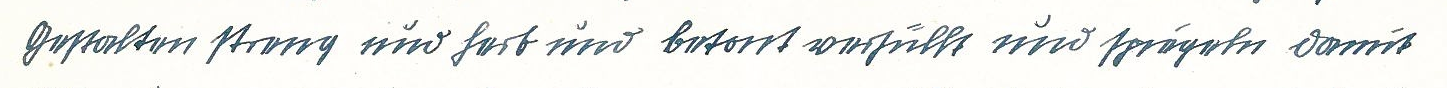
Gestalten streng und hart und betont verhüllt und spiegeln damit
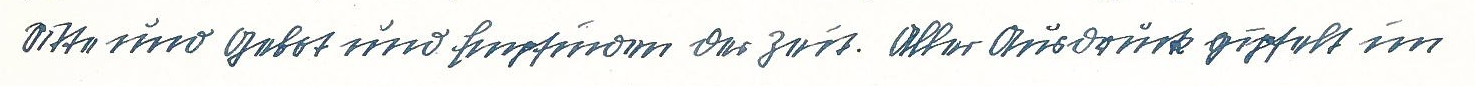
Sitte und Gebot und Empfinden der Zeit. Aller Ausdruck gipfelt im
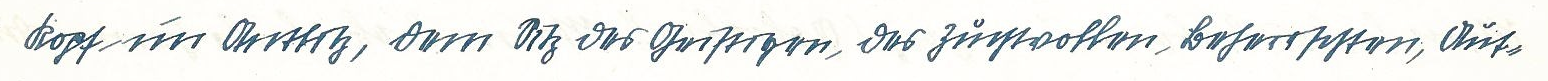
Kopf, im Antlitz, dem Sitz des Geistigen, des Zuchtvollen, Beherrschten, Auf¬
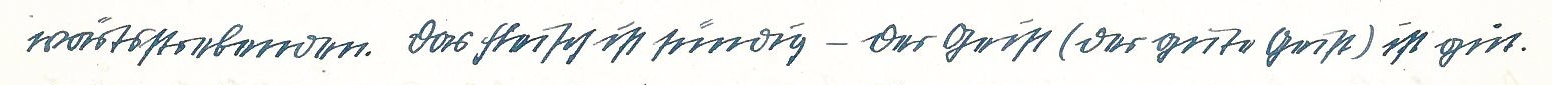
wärtsstrebenden. Das Fleisch ist sündig – der Geist (der gute Geist) ist gut.
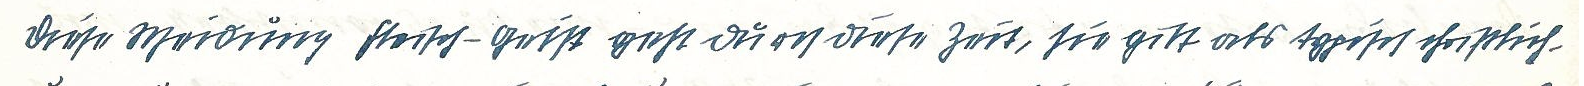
Diese Scheidung Fleisch – Geist geht durch diese Zeit, sie gilt als typisch christlich,
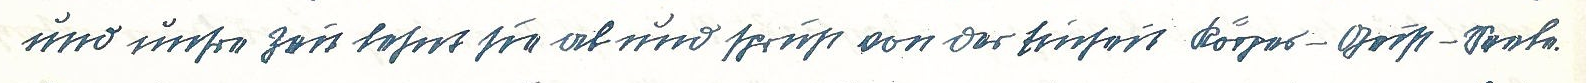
und unsre Zeit lehnt sie ab und spricht von der Einheit von Körper – Geist – Seele.
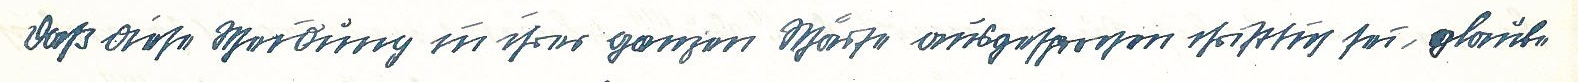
Daß diese Scheidung in ihrer ganzen Schärfe ausgesprochen christlich sei, glaube
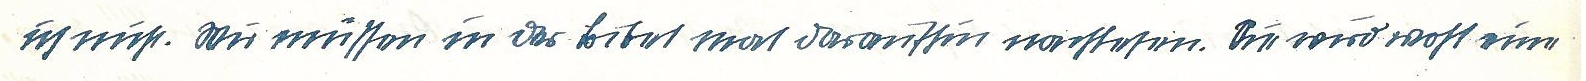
ich nicht. Wir müssen in der Bibel mal daraufhin nachlesen. Sie wird wohl eine
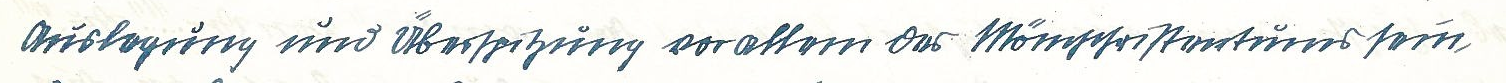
Auslegung und Übersetzung vor allem des Mönchschriftentums sein,
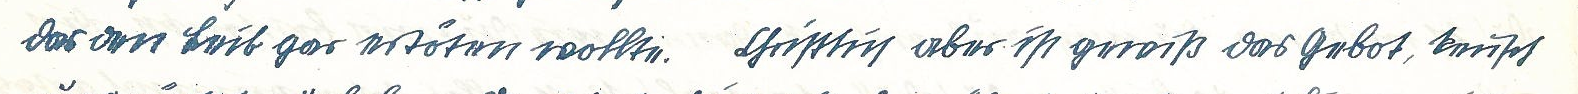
das den Leib gar ertöten wollte. Christlich aber ist gewiß das Gebot, keusch
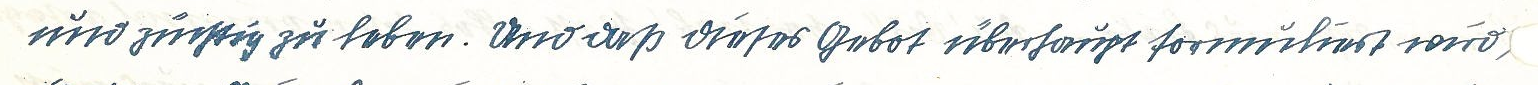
und züchtig zu leben. Und daß dieses Gebot überhaupt formuliert wird,
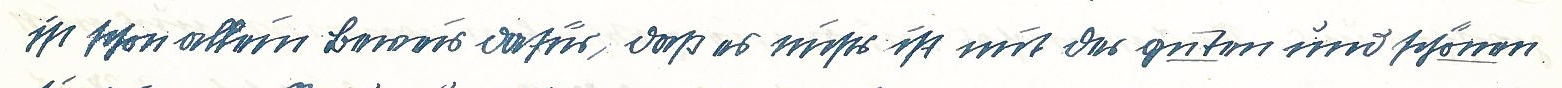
ist schon allein Beweis dafür, daß es nichts ist mit der guten und schönen
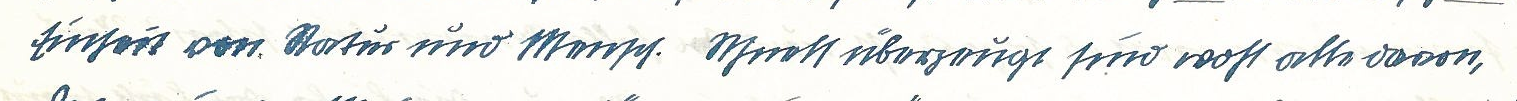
Einheit von Natur und Mensch. Schnell überzeugt sind wohl alle davon,
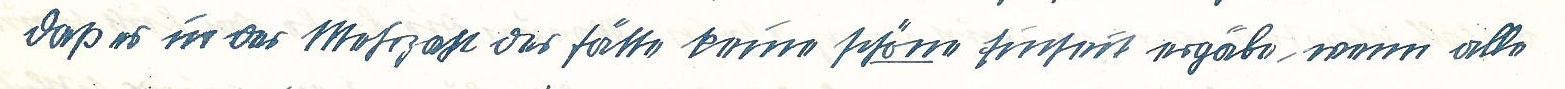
daß es in der Mehrzahl der Fälle keine schöne Einheit ergäbe, wenn alle
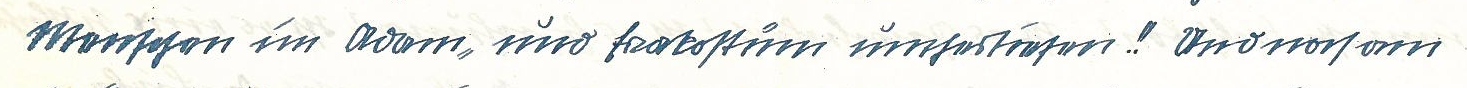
Menschen im Adam- und Evakostüm umherliefen!! Und noch am
